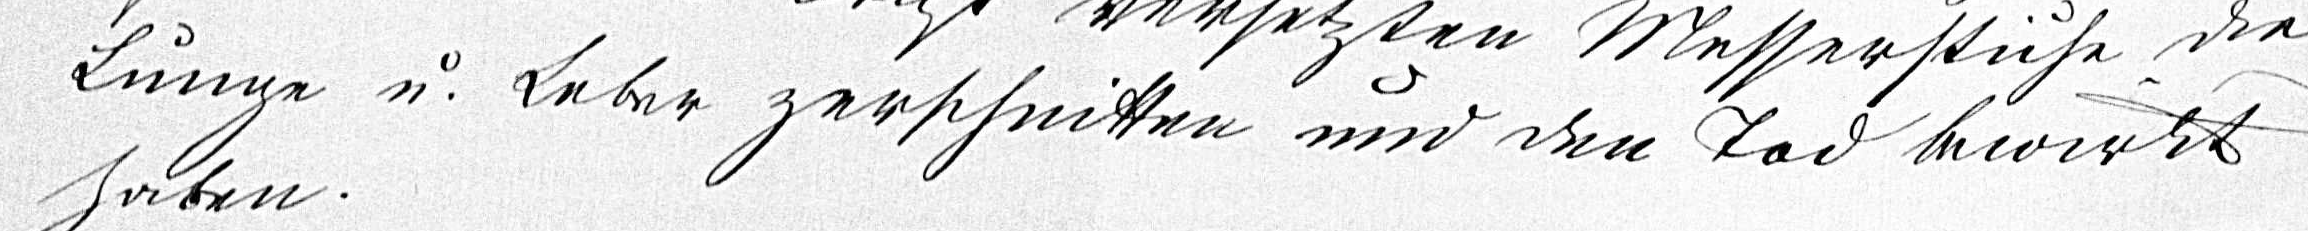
Lunge u. Leber zerschnitten und den Tod bewirkt
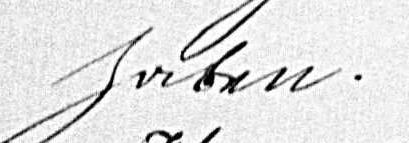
haben.
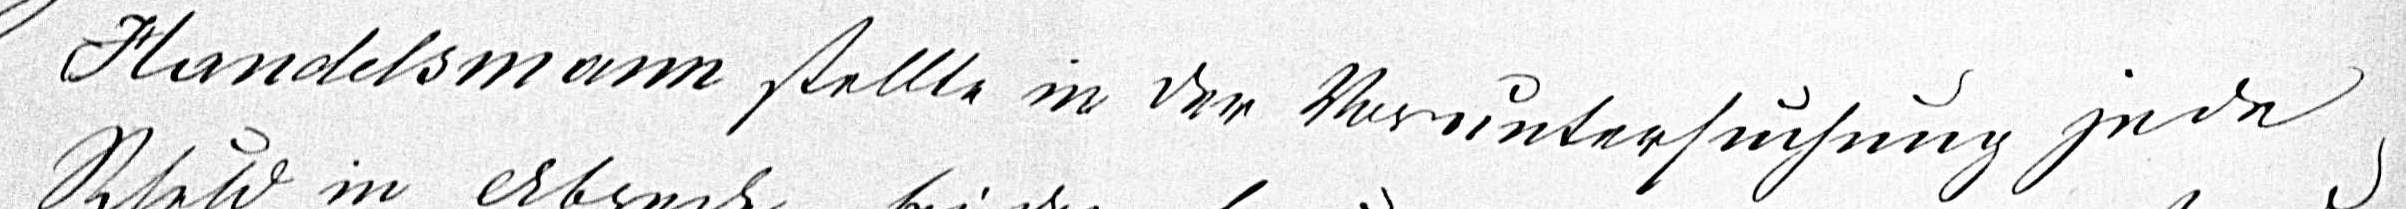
Handelsmann stellte in der Voruntersuchung jede
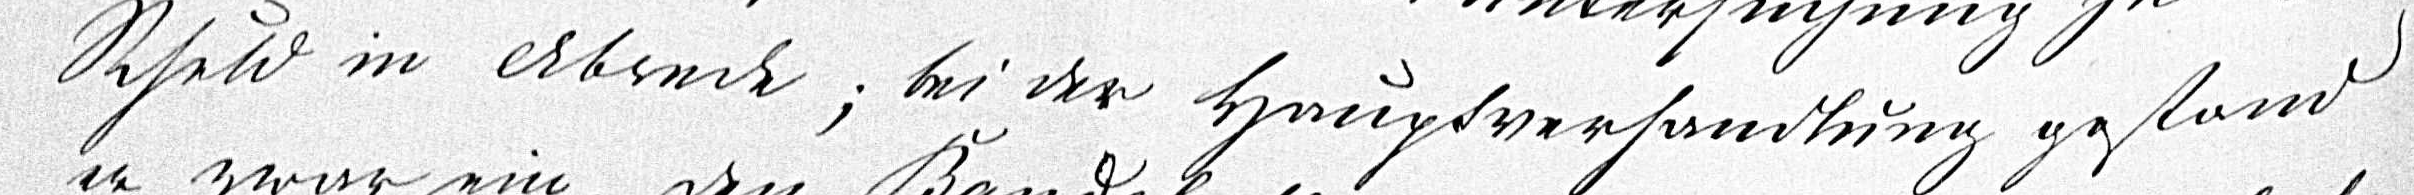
Schuld in Abrede; bei der Hauptverhandlung gestand
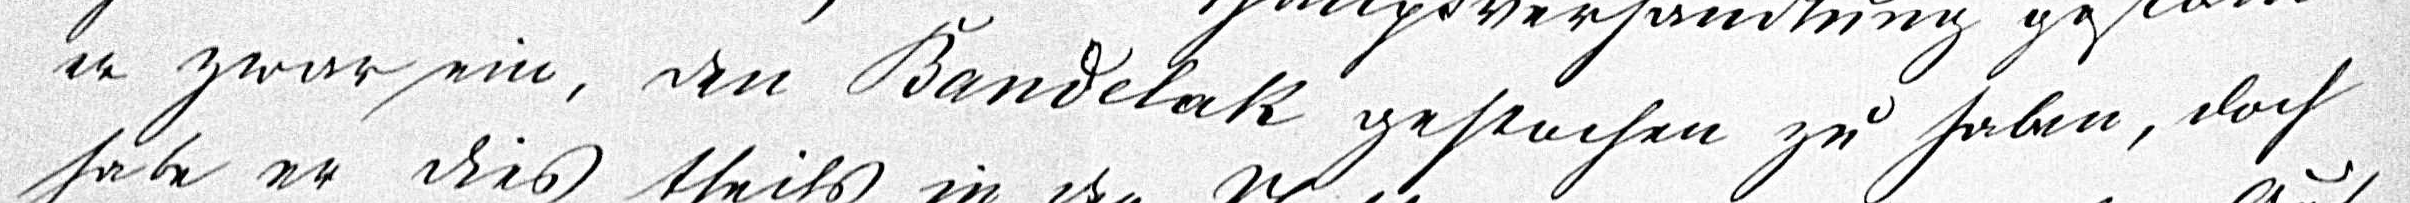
er zwar ein, den Bandelak gestochen zu haben, doch
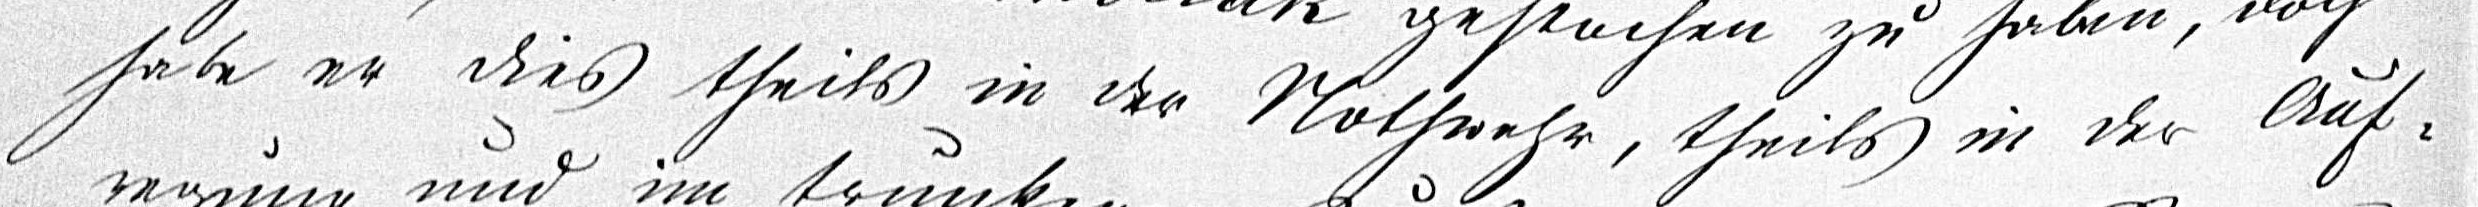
habe er dies theils in der Nothwehr, theils in der Auf¬
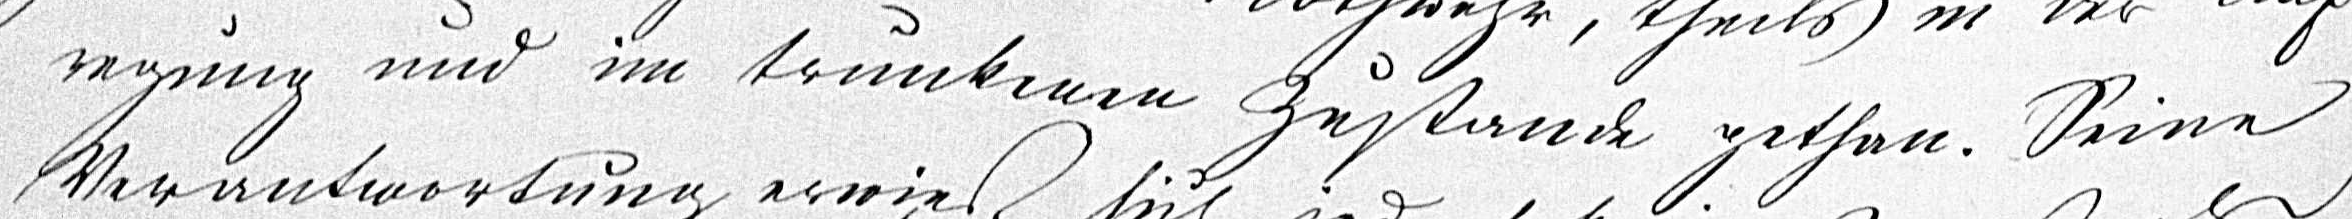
regung und im trunkenen Zustande gethan. Seine
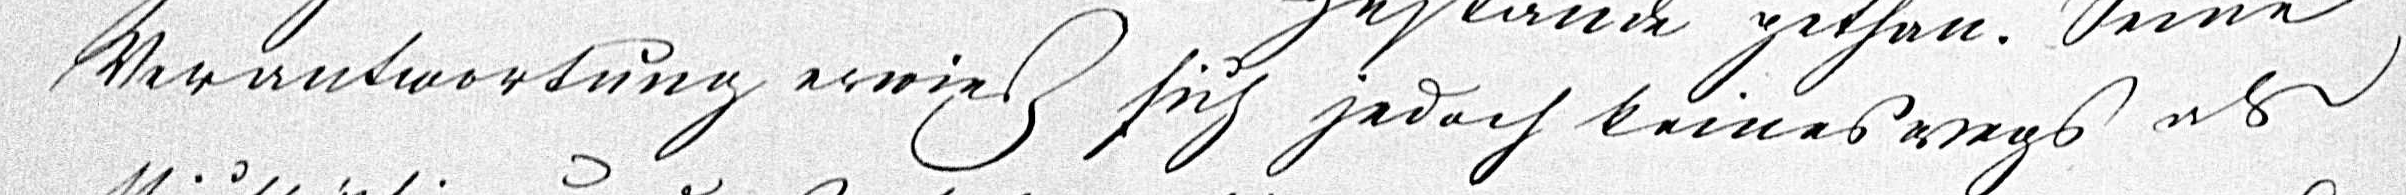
Verantwortung erwieß sich jedoch keineswegs als
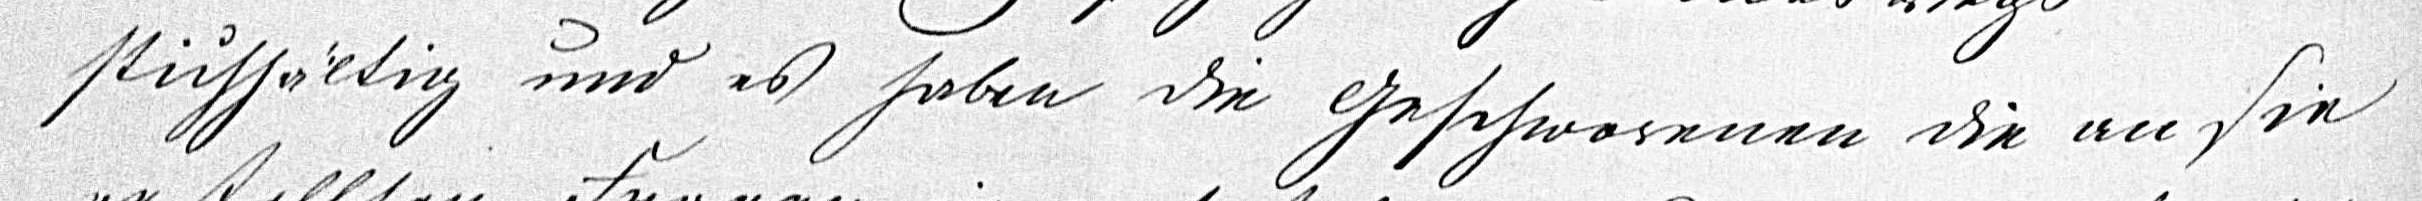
stichhaltig und es haben die Geschworenen die an sie
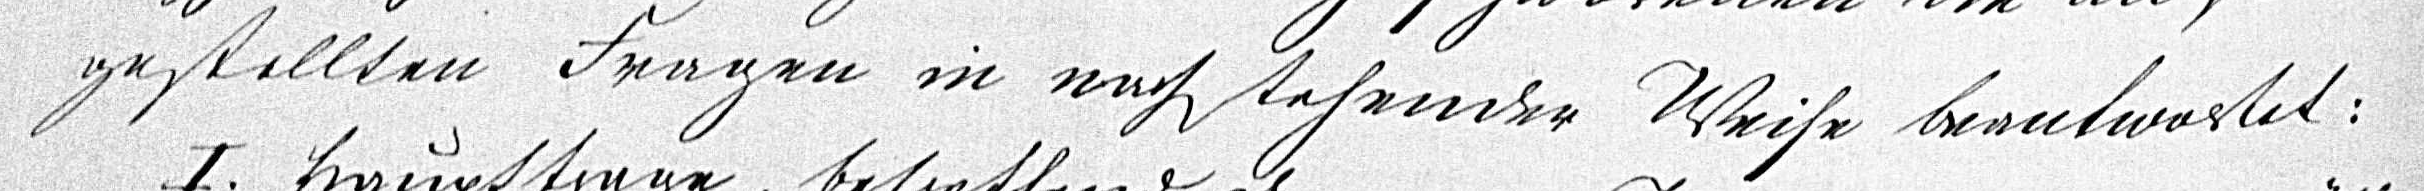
gestellten Fragen in nachstehender Weise beantwortet:
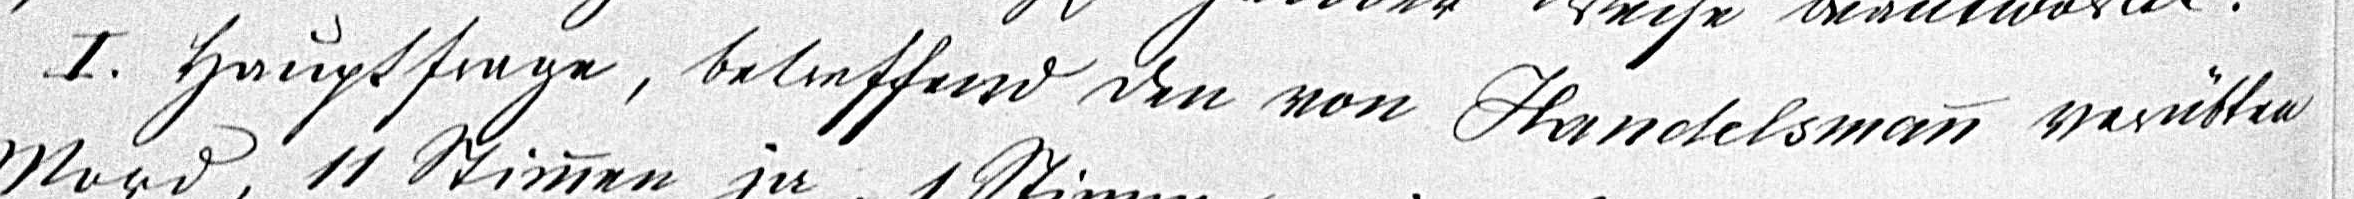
I. Hauptfrage, betreffend den von Handelsmann verübten
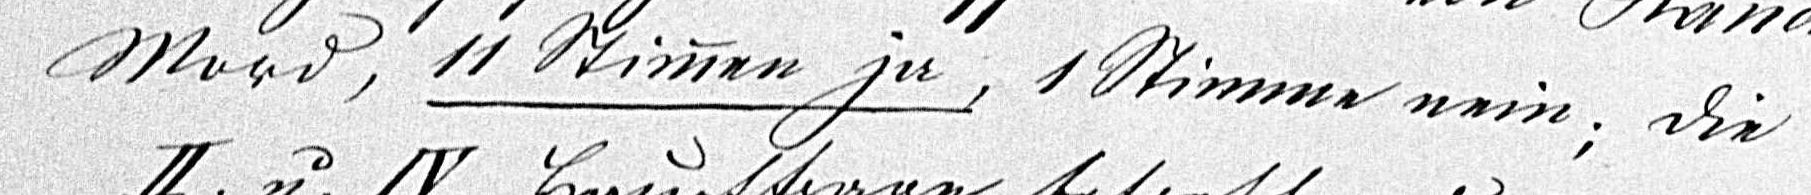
Mord, 11 Stimmen ja, 1 Stimme nein; die
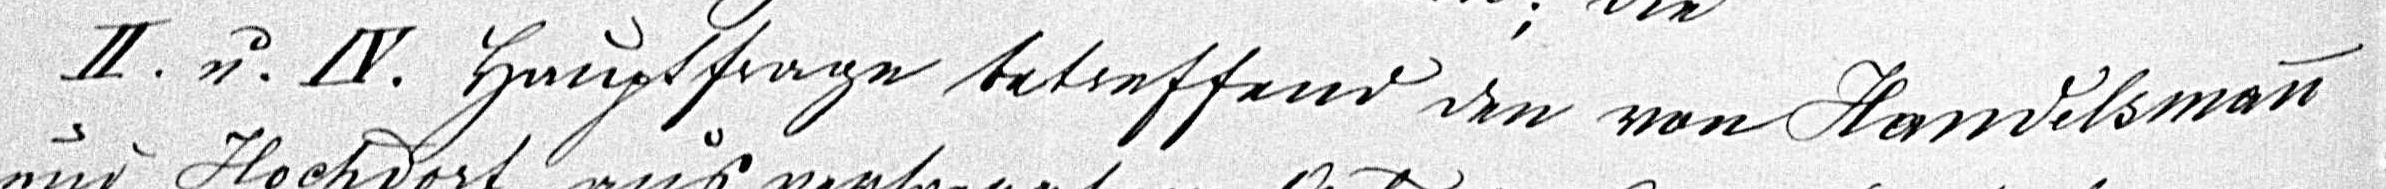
II. u. IV. Hauptfrage betreffend den von Handelsmann
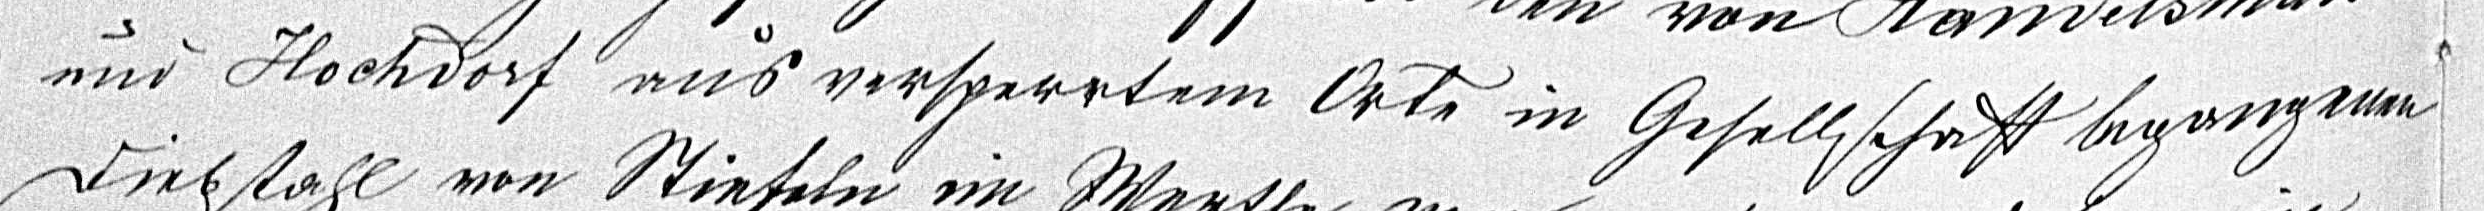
und Hochdorf aus versperrten Orte in Gesellschaft begangenen
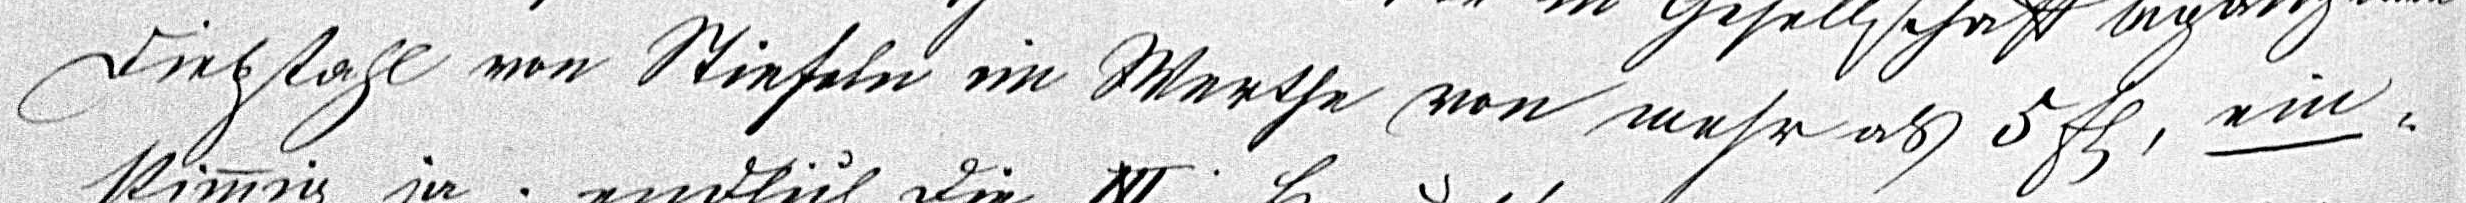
Diebstahl von Stiefeln im Werthe von mehr als 5 fl, ein¬
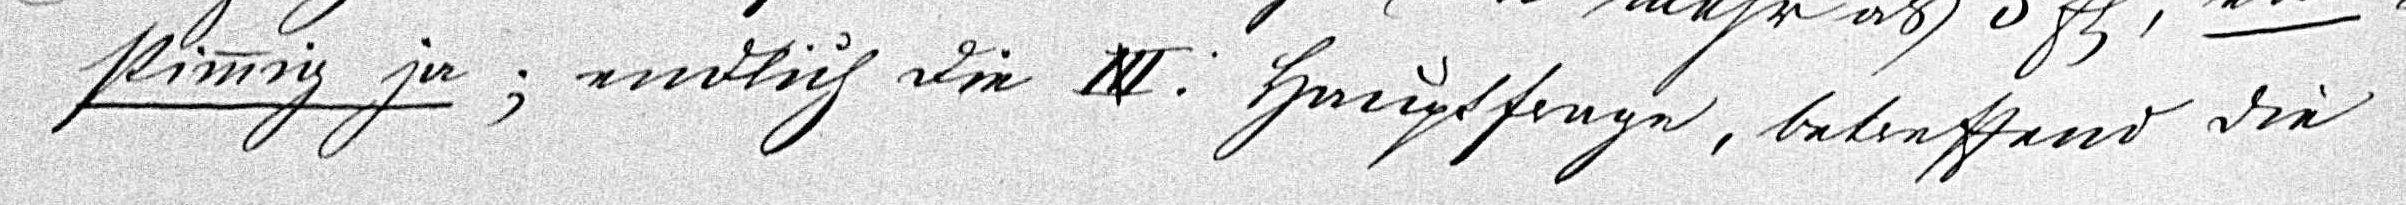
stimmig ja; endlich die III. Hauptfrage, betreffend die
